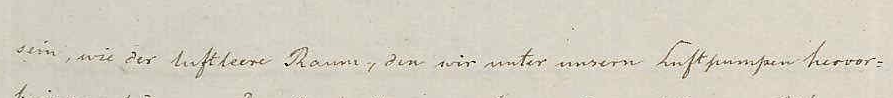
sein, wie der luftleere Raum, den wir unter unsern Luftpumpen hervor-
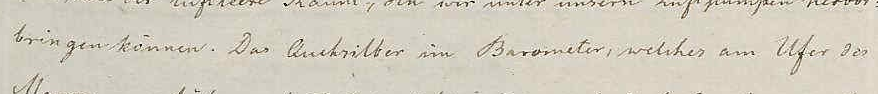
bringen können. Das Queksilber im Barometer, welches am Ufer des
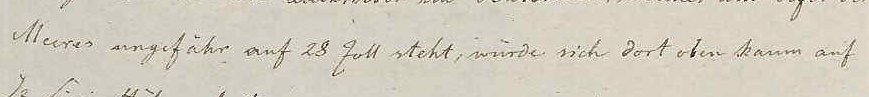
Meeres ungefähr auf 28 Zoll steht, würde sich dort oben kaum auf
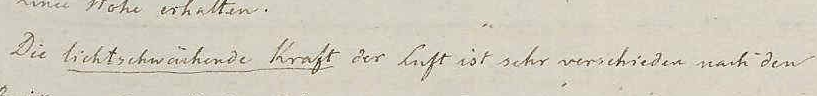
Die lichtschwächende Kraft der Luft ist sehr verschieden nach den
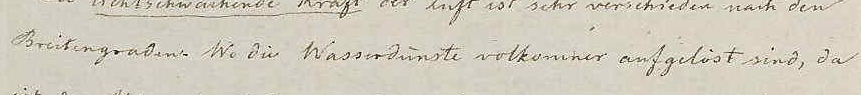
Breitengraden. Wo die Wasserdünste volkomner aufgelöst sind, da
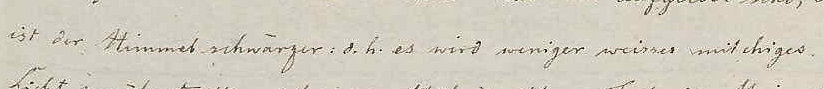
ist der Himmel schwärzer: d. h. es wird weniger weisses milchiges
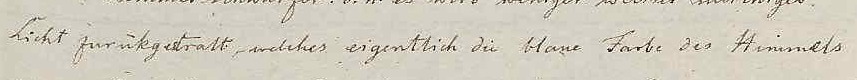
Licht zurükgestralt, welches eigentlich die blaue Farbe des Himmels
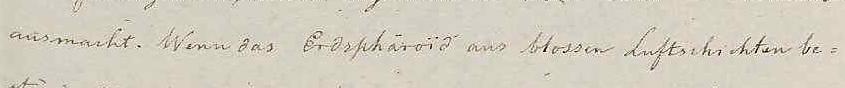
ausmacht. Wenn das Erdsphäroïd aus blossen Luftschichten be-
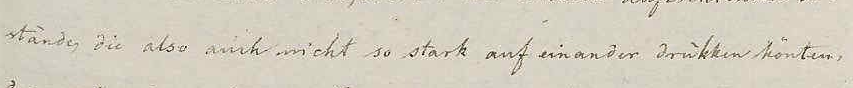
stände, die also auch nicht so stark auf einander drükken könten,
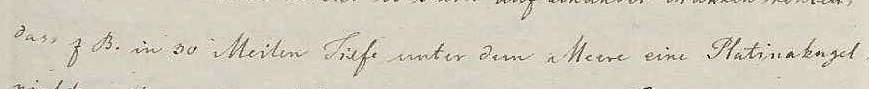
dass zB. in 30 Meilen Tiefe unter dem Meere eine Platinakugel
